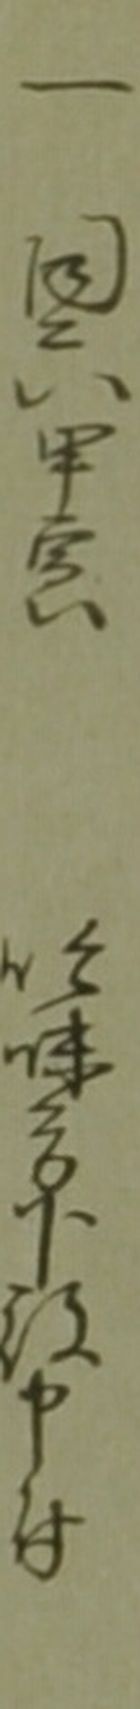一同六甲寅吟味方下役申付
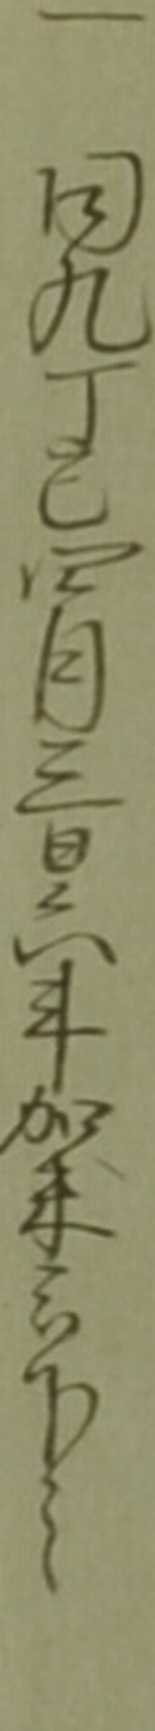一同九丁巳四月三日六斗加米被下之
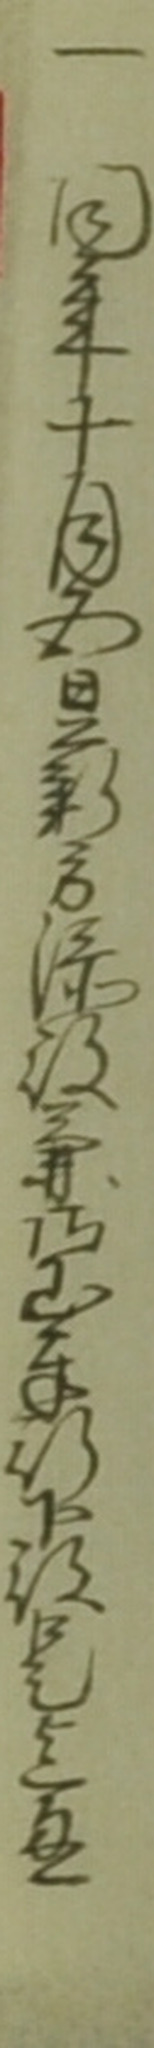一同年十月五日薪方添役兼御山奉行下役是迄通
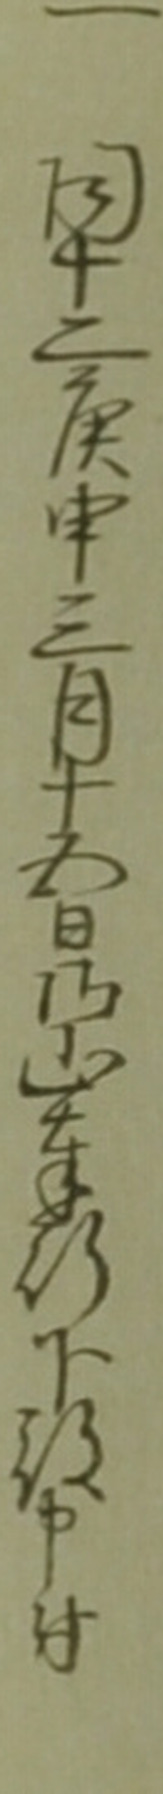一同十二庚申三月十五日御山奉行下役申付

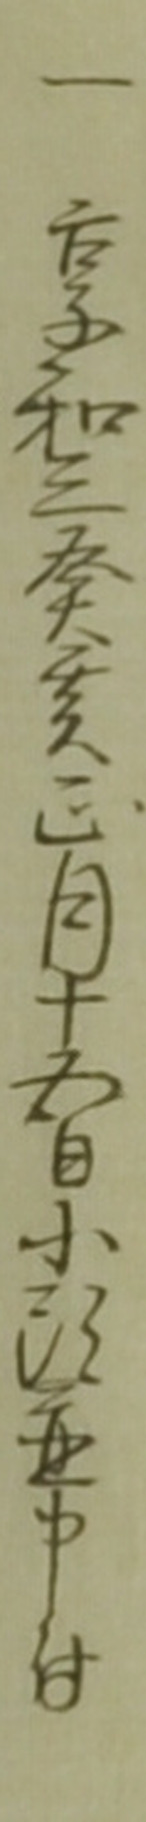一享和三癸亥正月十五日小頭並申付
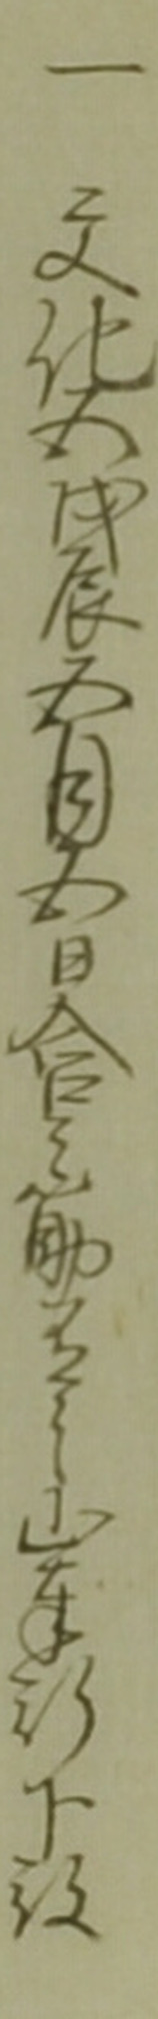一文化五戊辰五月五日含之筋有之山奉行下役
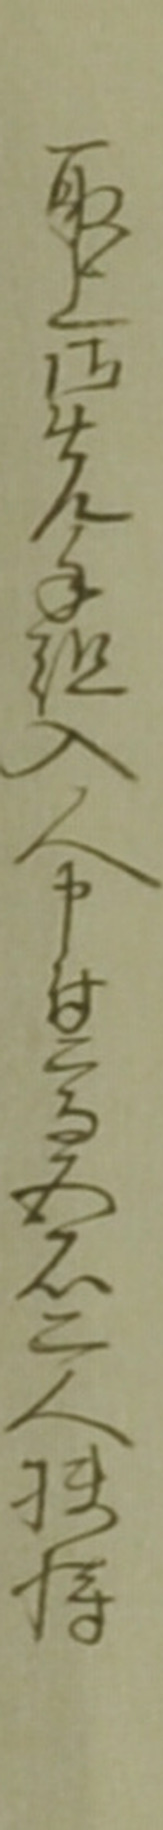取上御先手組入人申付高五石二人扶持
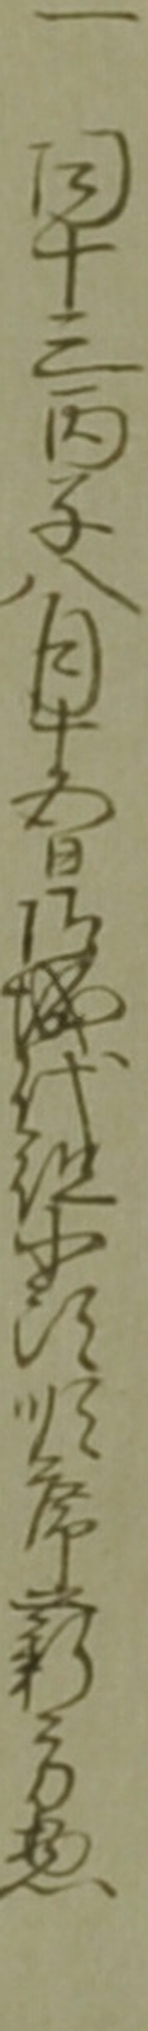一同十三丙子八月十五日御城代組小頭順席薪方惣
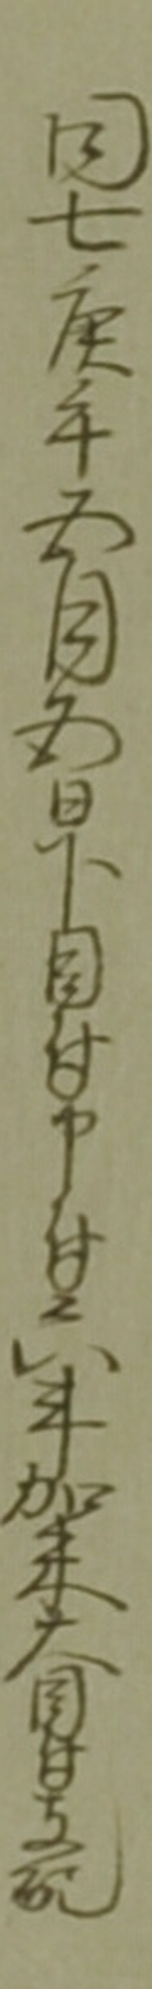一同七庚午五月五日下目付申付六斗加米大目付支配
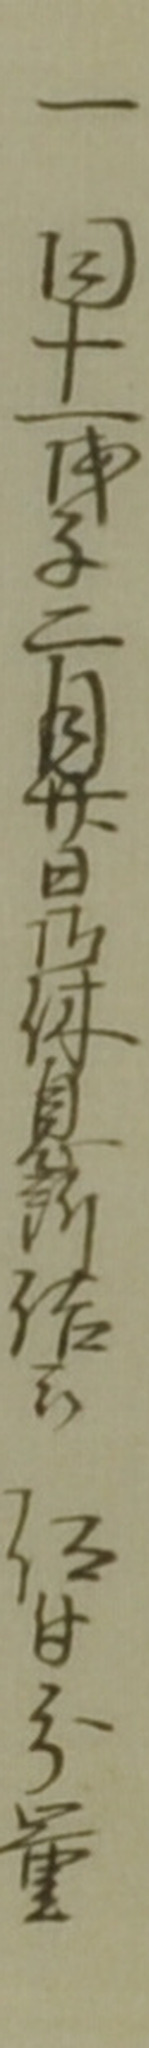一同十一戊子二月廿日御休息所詰被仰付分量
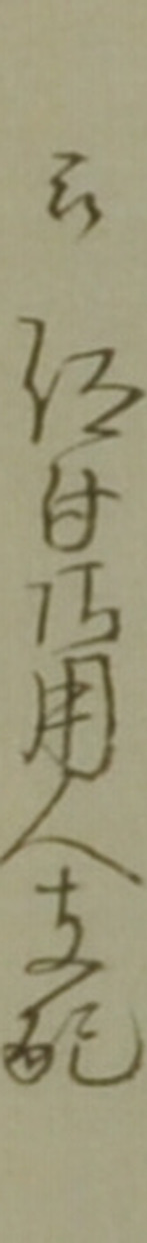被仰付御用人支配
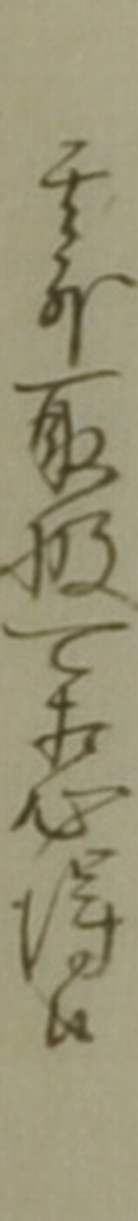其外取扱可相心得候
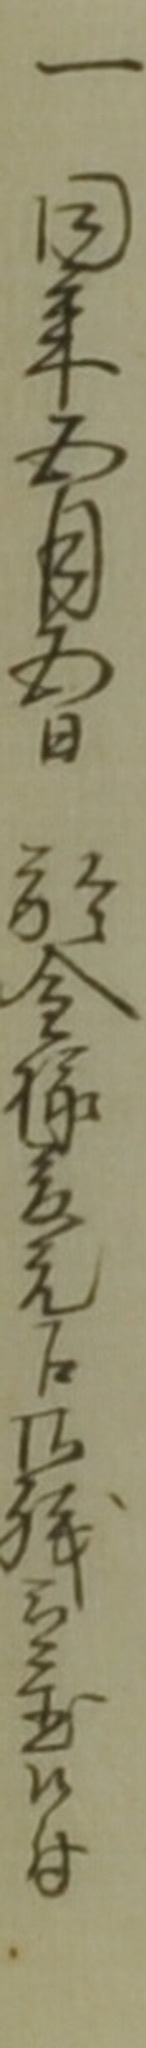一同年五月五日於金様度元江御残被置候付
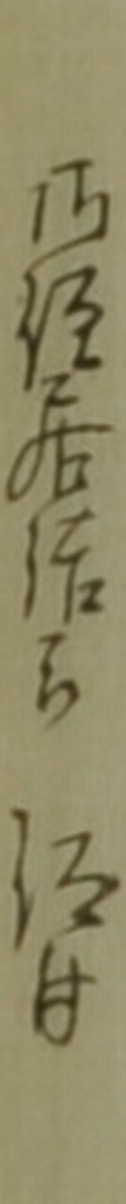御住居詰被害仰付
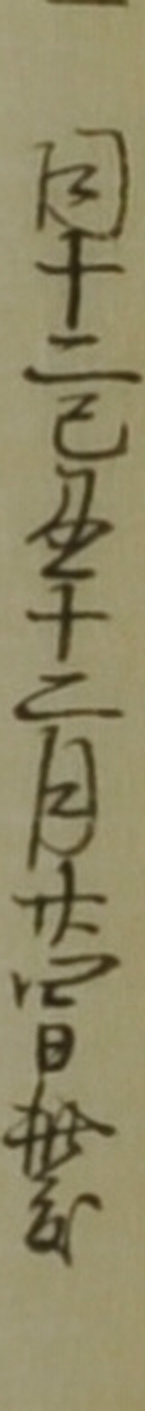一同十二己丑十二月廿四日此度
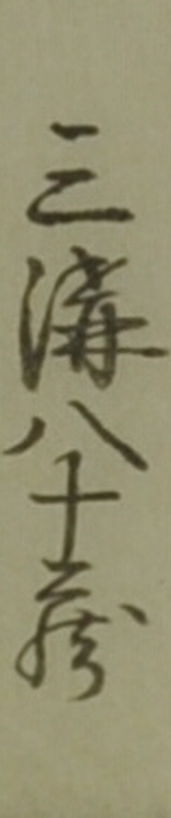三溝八十蔵
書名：無足諸士勤仕録（九）
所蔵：伊那市立高遠町図書館・合同会社AMANE
